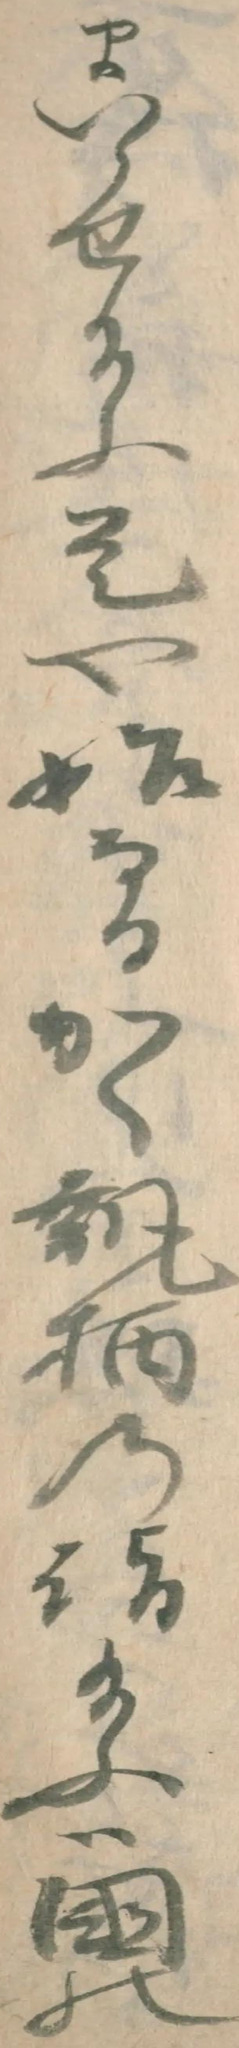まいらせ給ふ是や始なるかく執柄の詣給ふは国の

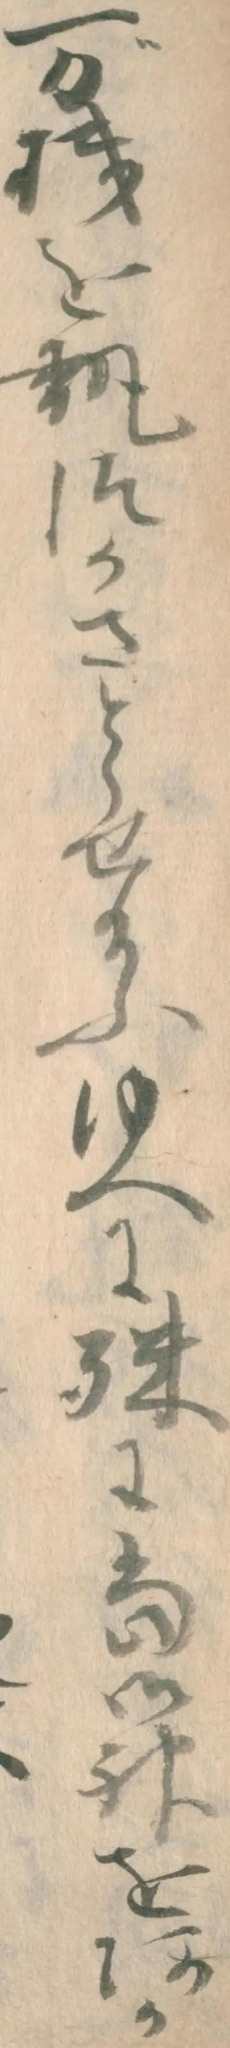万機を執つかさとらせ給ふゆへに殊に当御神をあか
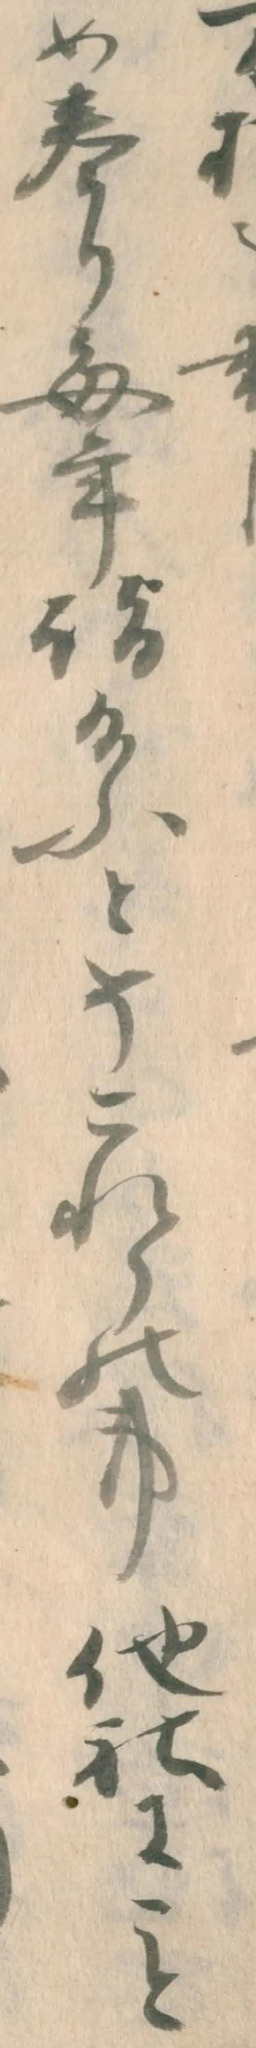め奉り毎年詣給ふとそこれらの事他社にこと
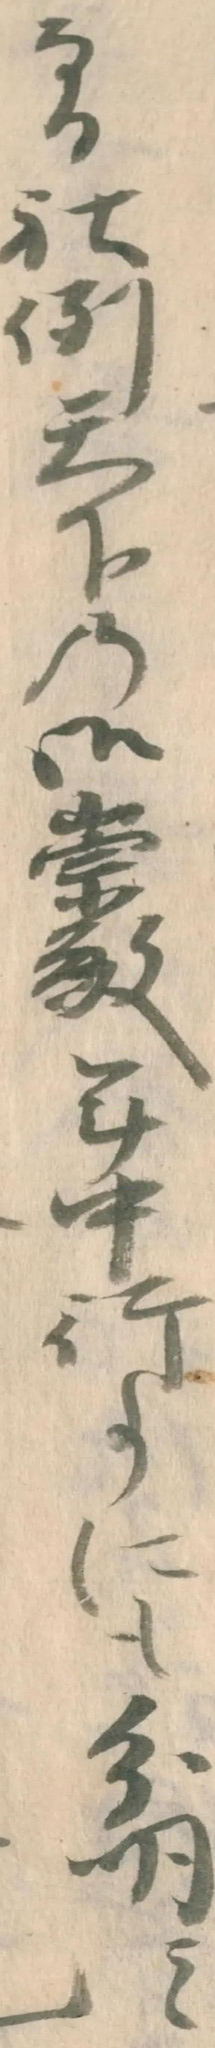なる社例天下の御崇敬年中行事にも分明に候
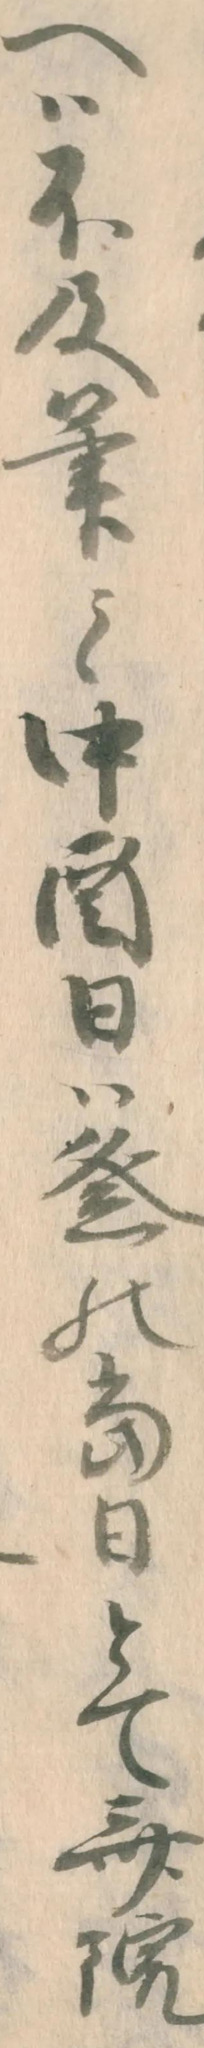へは不及筆に候中酉日は祭の当日とて齋院
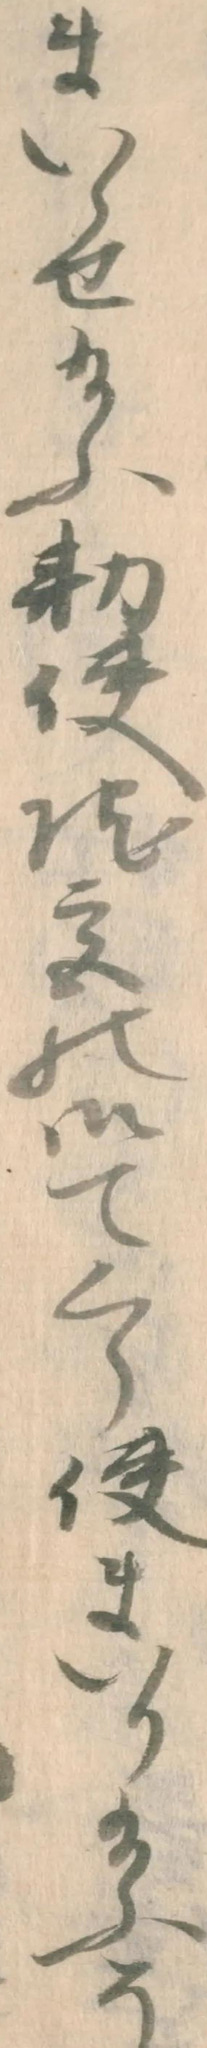まいらせ給ふ勅使院宮の御てくら使まいり給ふそ
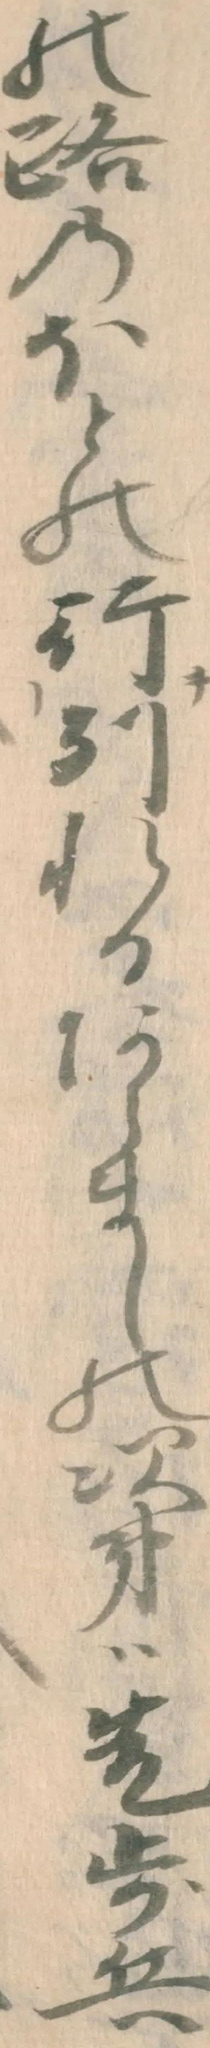の路のほとの行-列れるあらましの次第は先歩兵
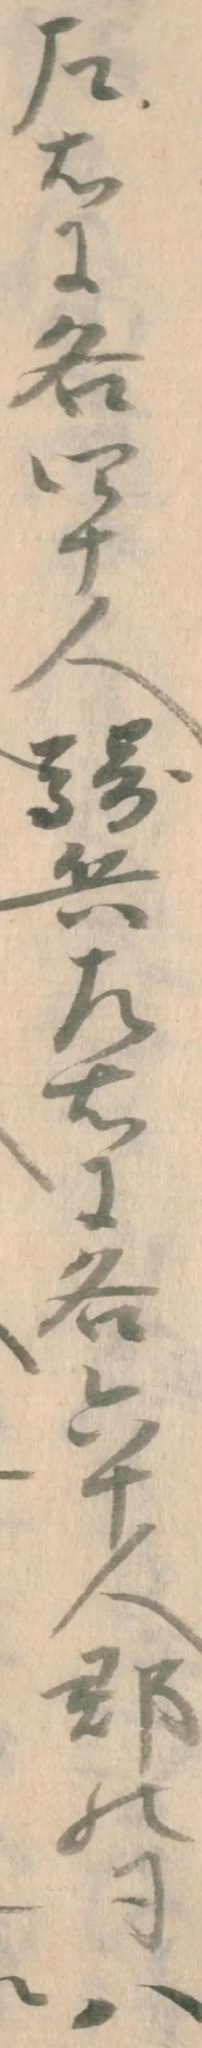左右に各四十人騎兵左右に各六十人郡の司八
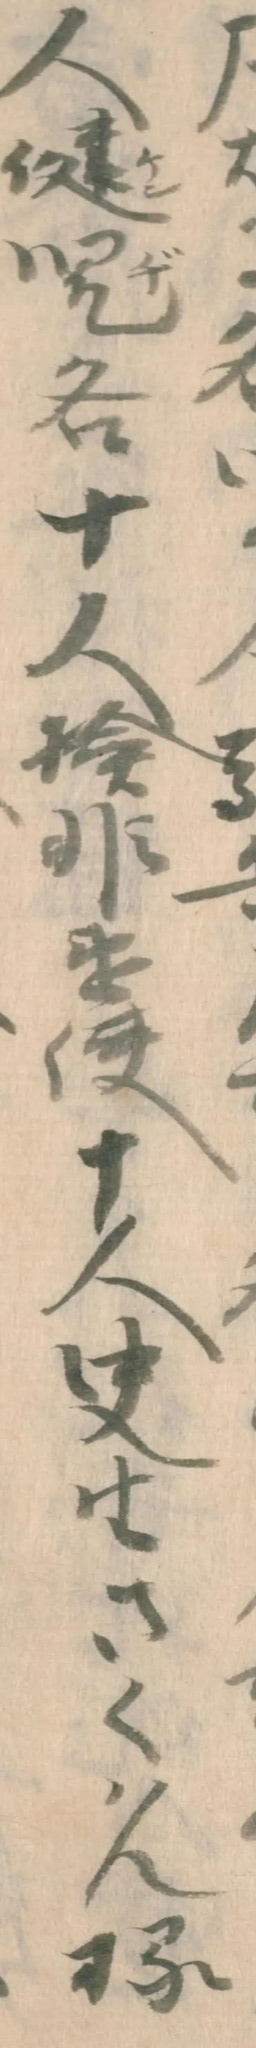人健児各十人検非違使十人史生さくはん掾
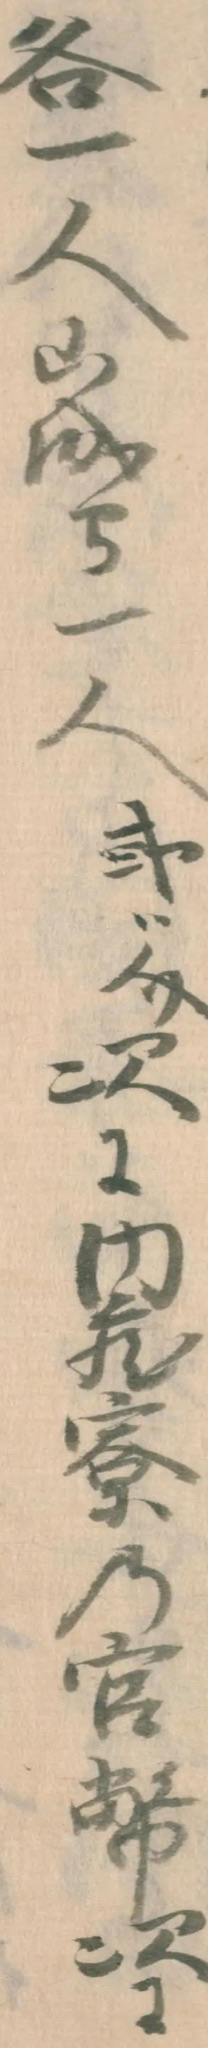各一人山城守一人或は介次に内蔵寮の官幣次に
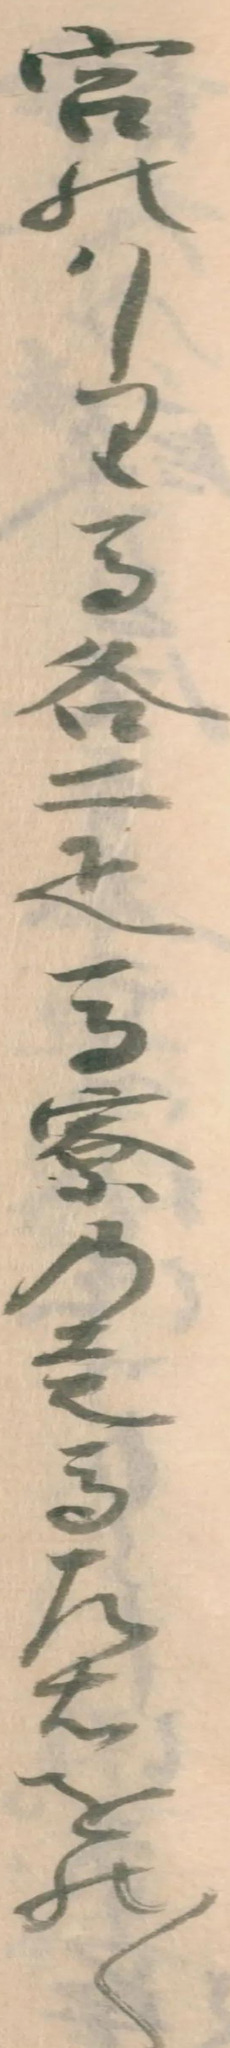宮のはしり馬各二疋馬寮の走馬左右をの〳〵
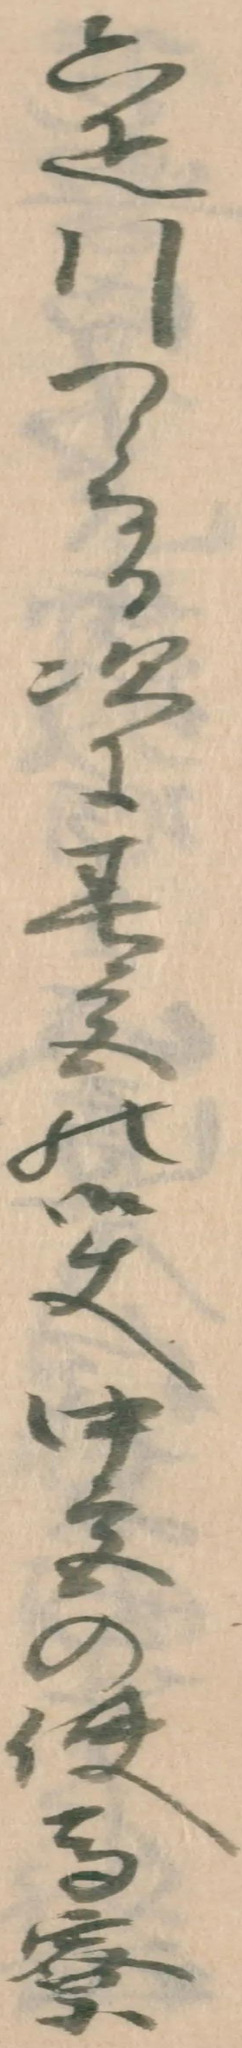六疋引つらなる次に春宮の御使中宮の使馬寮
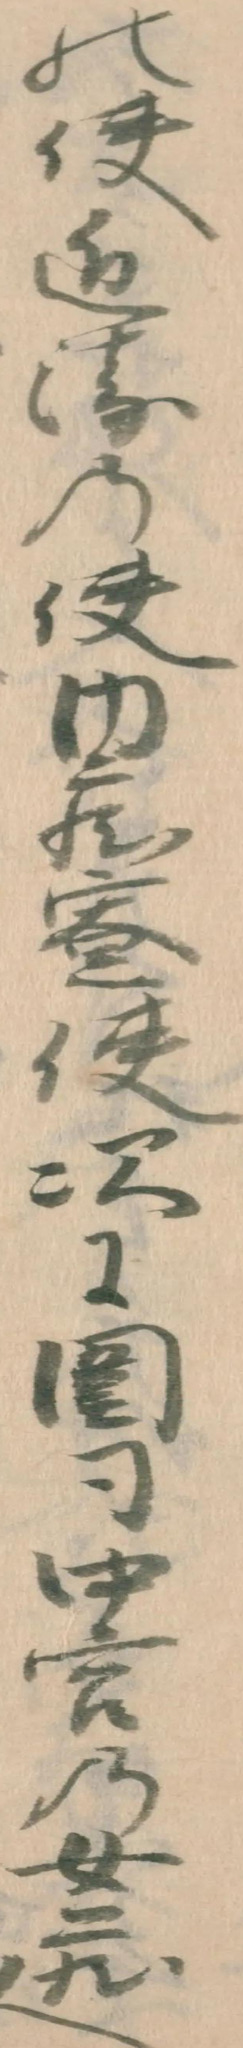の使近衛の使内蔵寮使次に囲司中宮の女蔵人
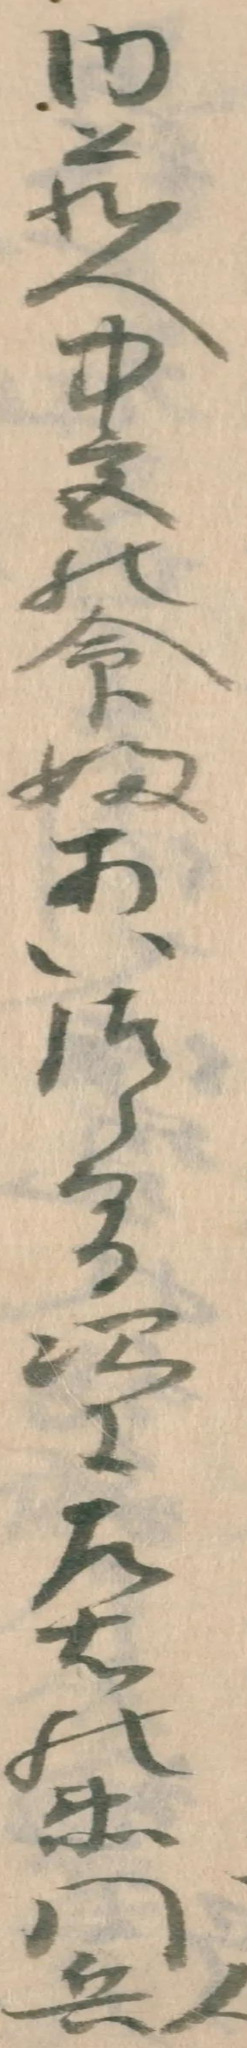内蔵人中宮の命婦あいつらなる次に左右の衛門兵
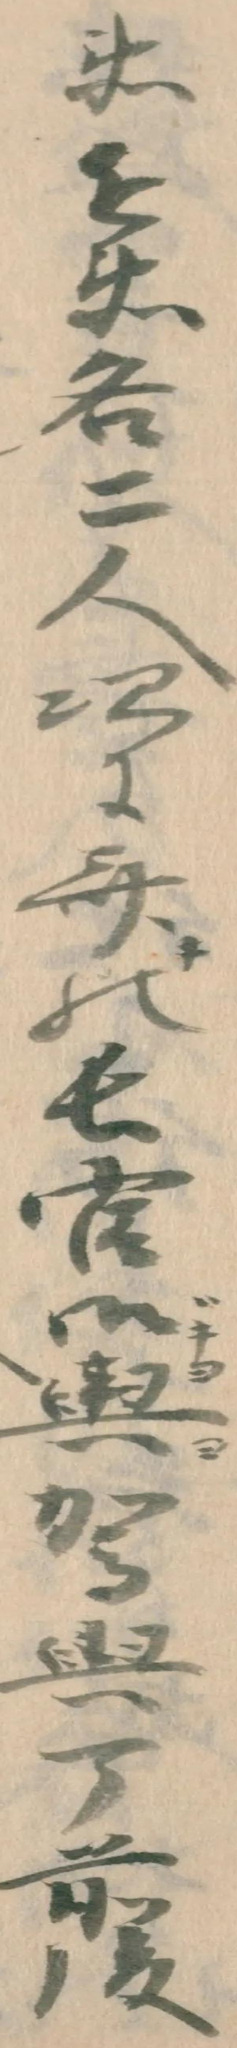衛近衛各二人次に齋長官御輿駕輿丁前後
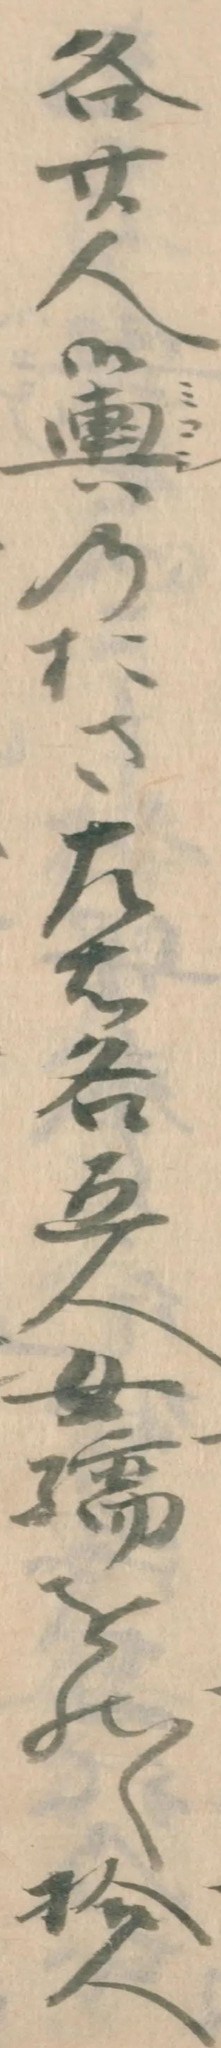各廿人御輿のおさ左右各五人女孺をの〳〵拾人
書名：賀茂社記録. 第1冊
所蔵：国立国会図書館 National Diet Library, JAPAN
